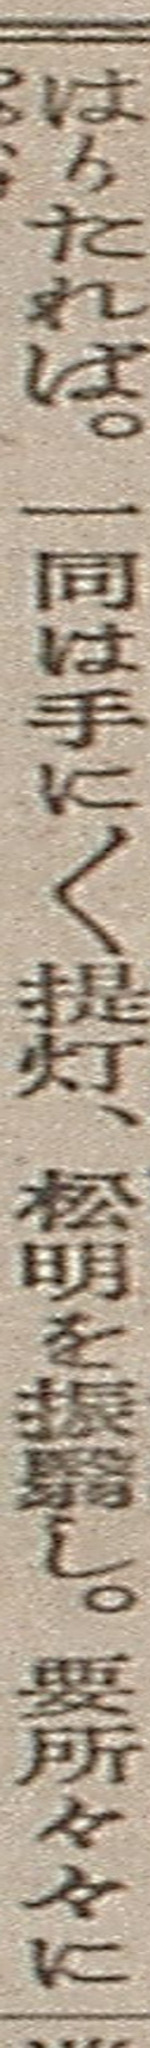はりたれば。一同は手に〳〵提灯、松明を振翳し。要所々々に
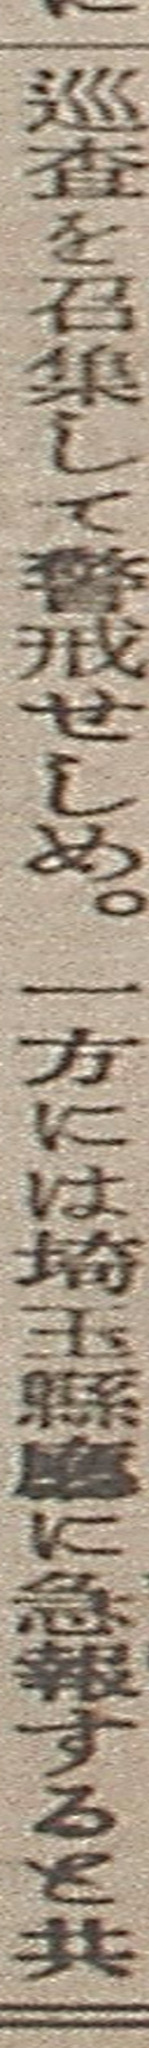巡査を召集して警戒せしめ。一方には埼玉県庁に急報すると共
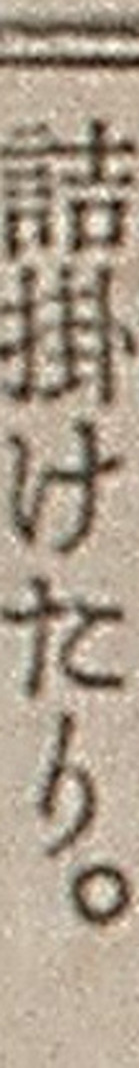詰掛けたり。
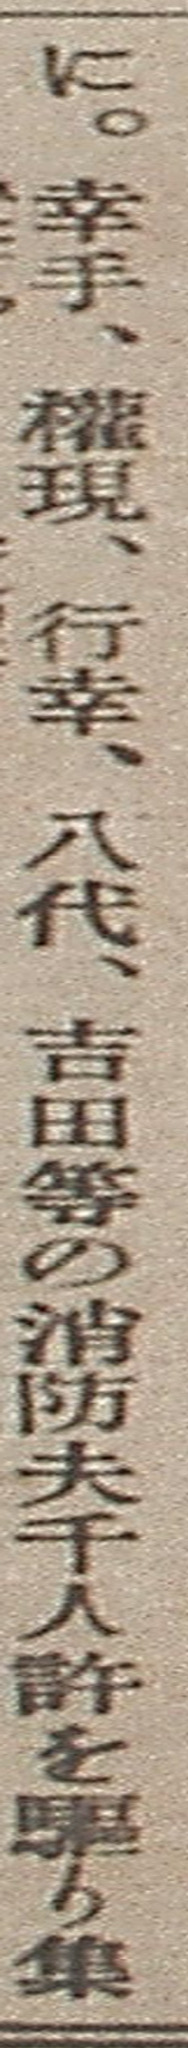に。幸手、権現、行幸、八代、吉田等の消防夫千人許を駆り集
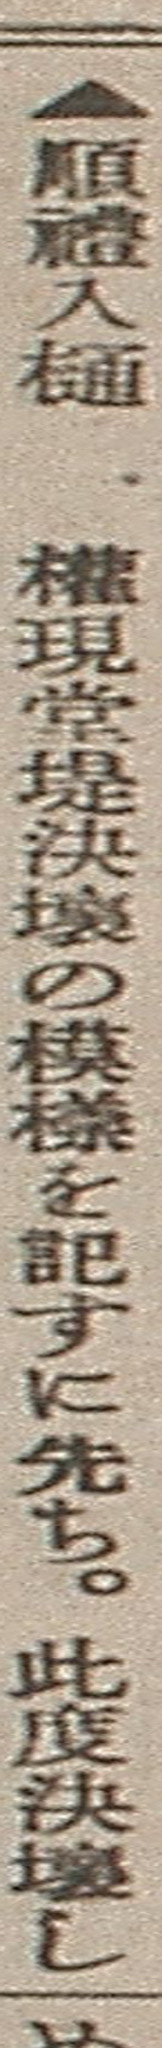▲順禮入樋権現堂堤決壊の模様を記すに先ち。此度決壊し
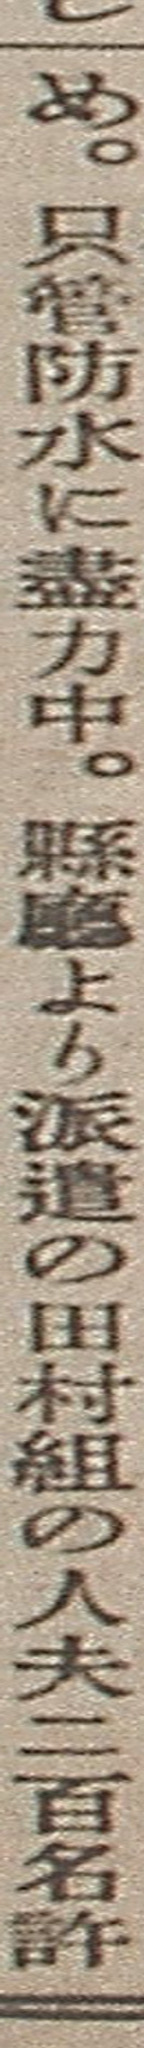め。只管防水に尽力中。県庁より派遣の田村組の人夫二百名許
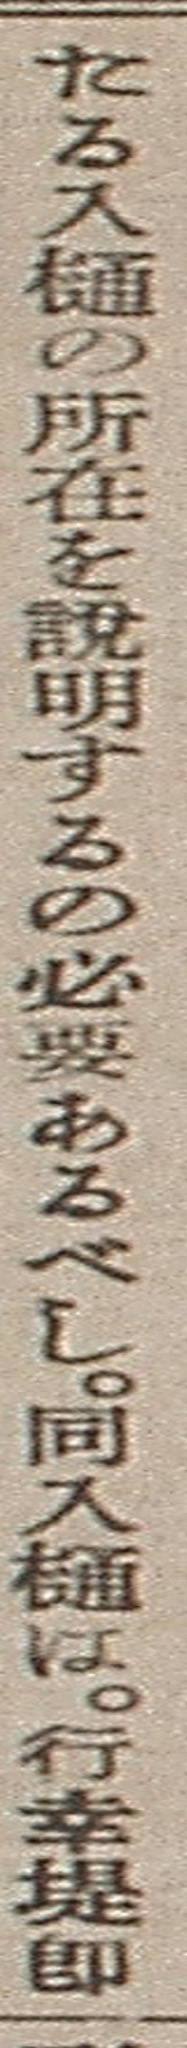たる入樋の所在を説明するの必要あるべし。同入樋は。行幸堤即
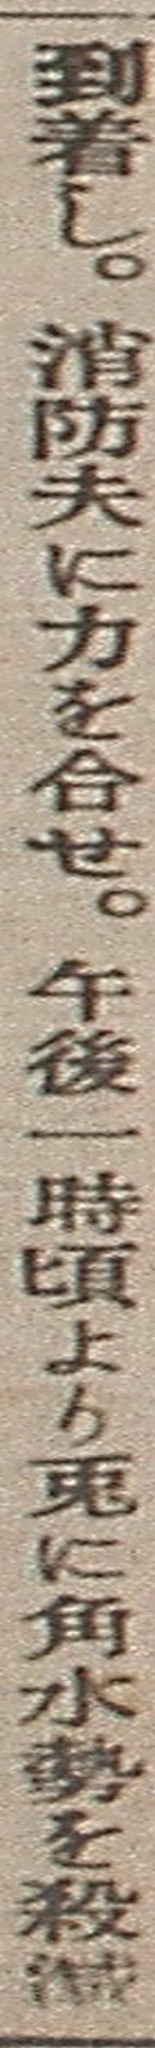到着し。消防夫に力を合せ。午後一時頃より兎に角水勢を殺減

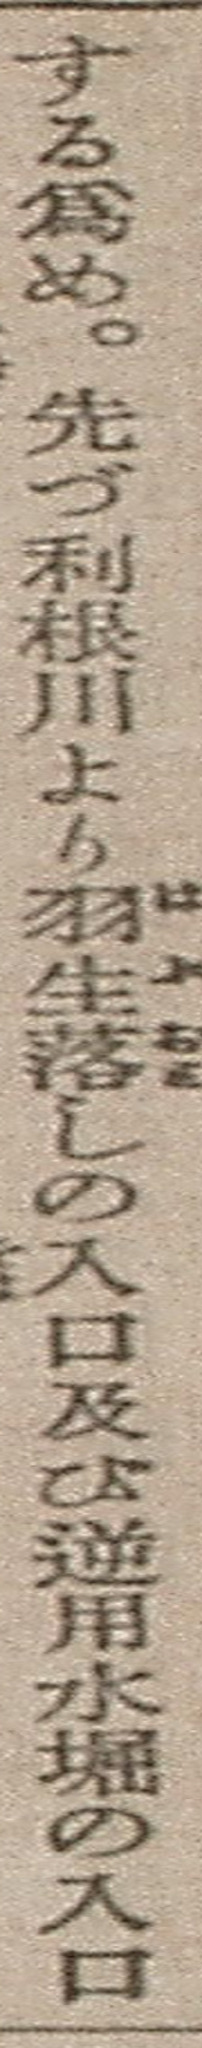する為め。先づ利根川より羽生落しの入口及び逆用水堀の入口
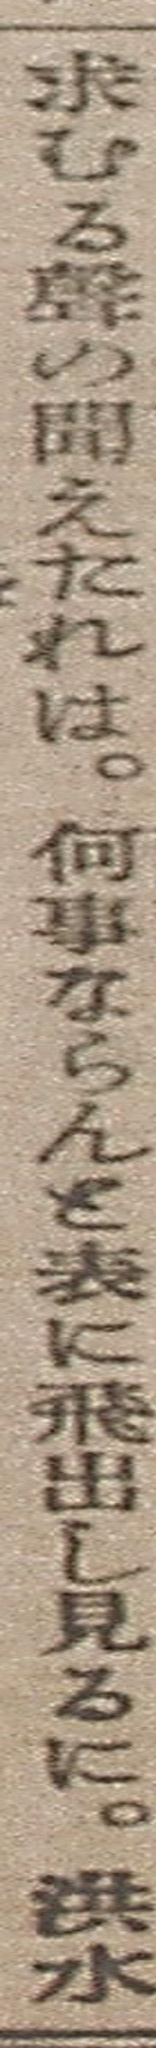求むる声の聞えたれは。何事ならんと表に飛出し見るに。洪水
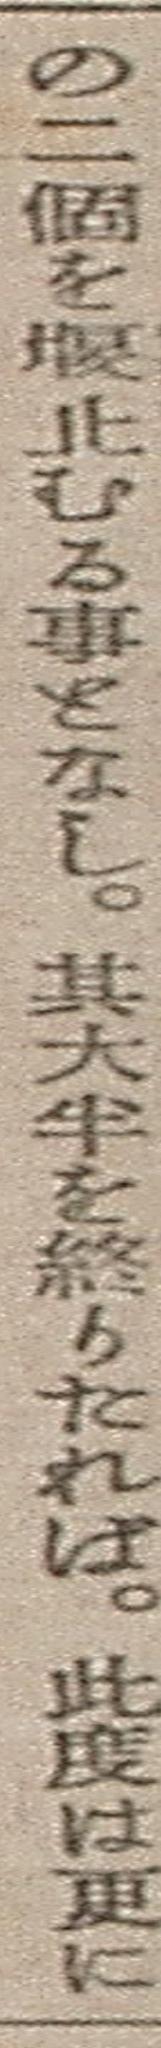の二個を堰止むる事となし。其大半を終りたれば。此度は更に
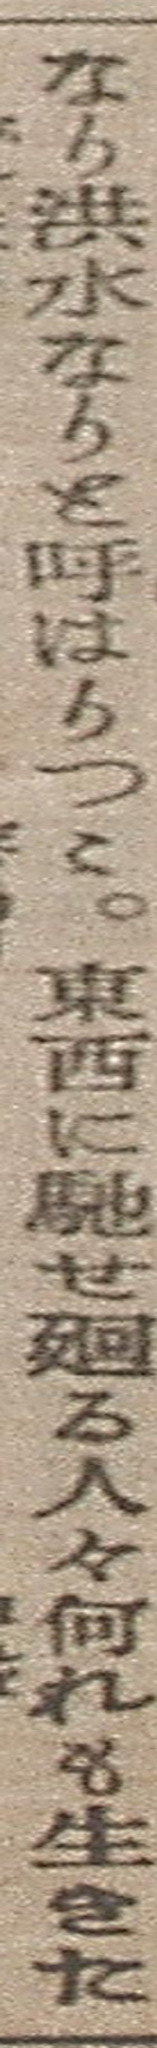なり洪水なりと呼はりつ〻。東西に馳せ廻る人々何れも生きた
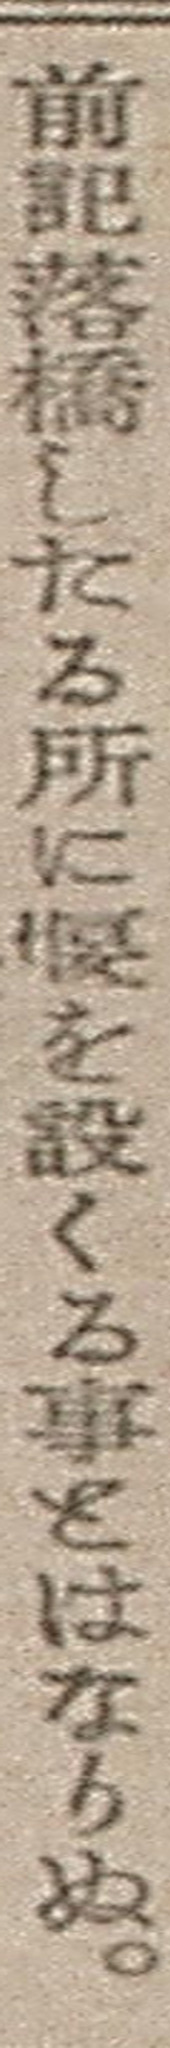前記落橋したる所に堰を設くる事とはなりぬ。
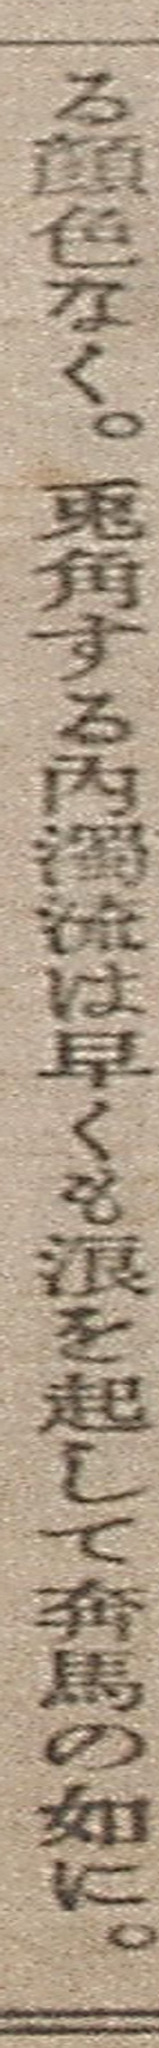る顔色なく。兎角する内濁流は早くも浪を起して奔馬の如に。
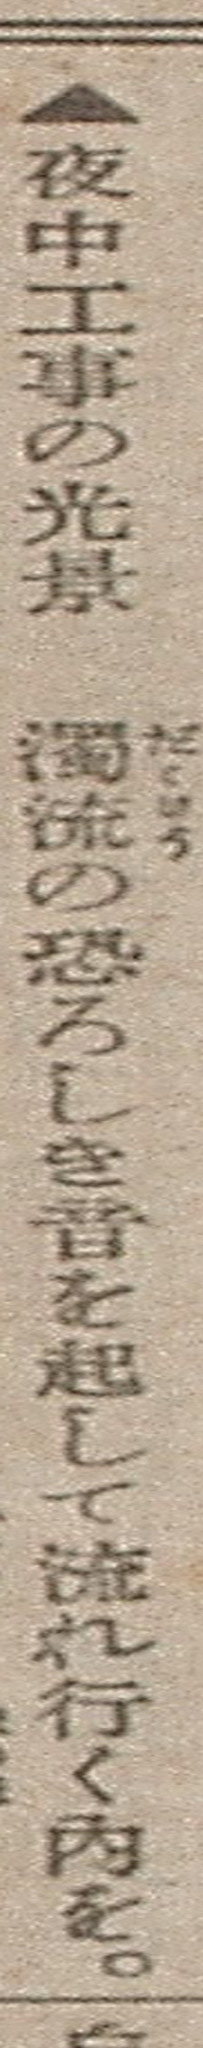▲夜中工事の光景濁流の恐ろしき音を起して流れ行く内を。
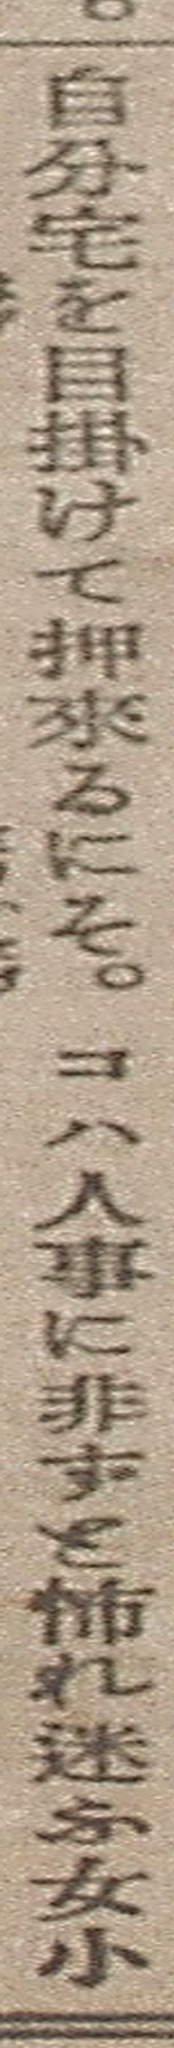自分宅を目掛けて押来るにそ。コハ人事に非ずと怖れ迷ふ女子
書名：風俗畫報臨時増刊第百九十九號　明治三十二年十月各地災害圖會（前編之續）
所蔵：東京大学地震研究所図書室 Earthquake Research Institute Library, The University of Tokyo, JAPAN
